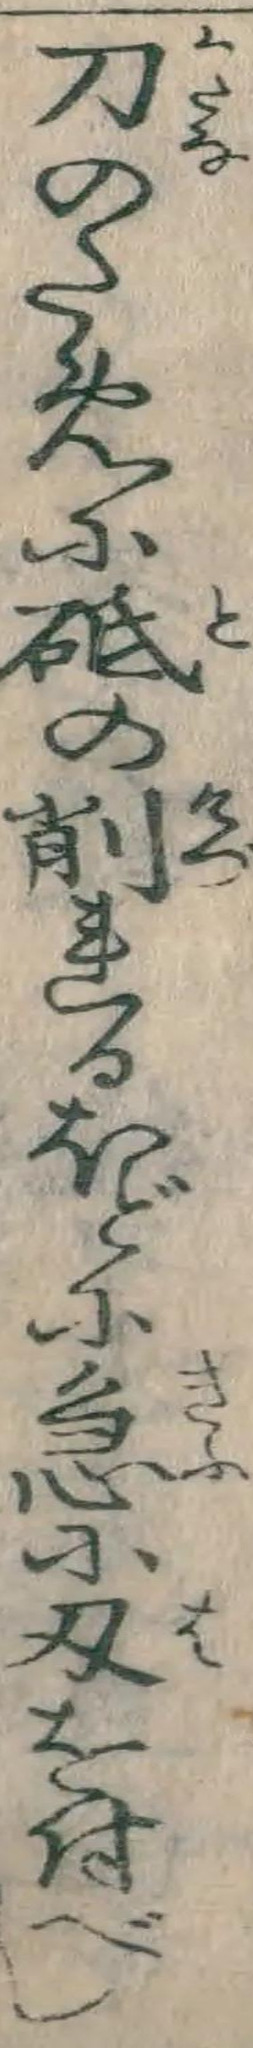刀のために砥の削れるほどに急に刃を付べし
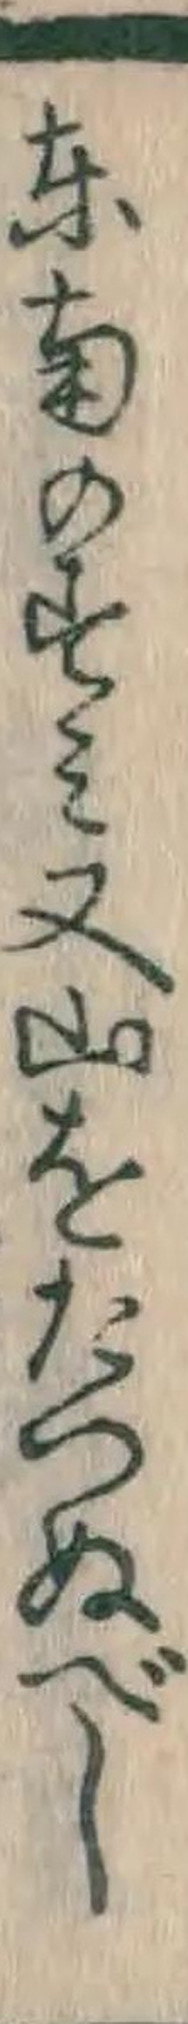東南のすみ又山をたつぬべし
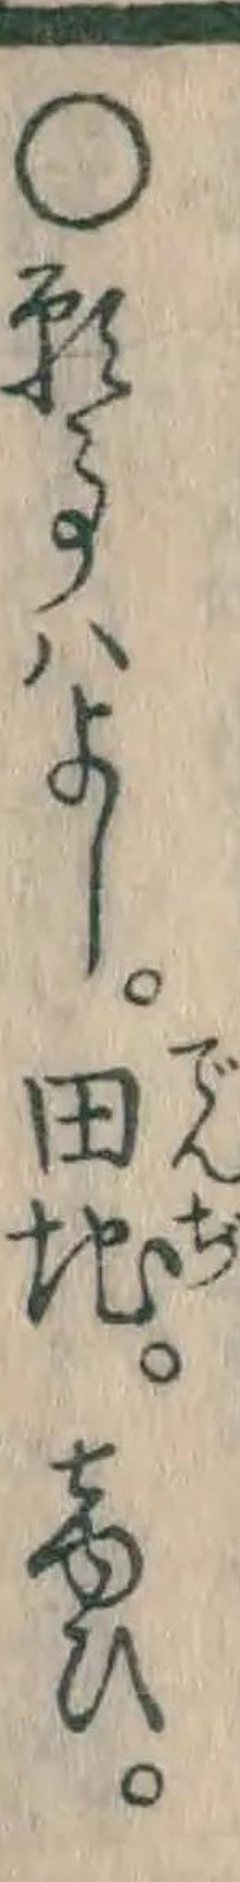○願事はよし。田地。商ひ。
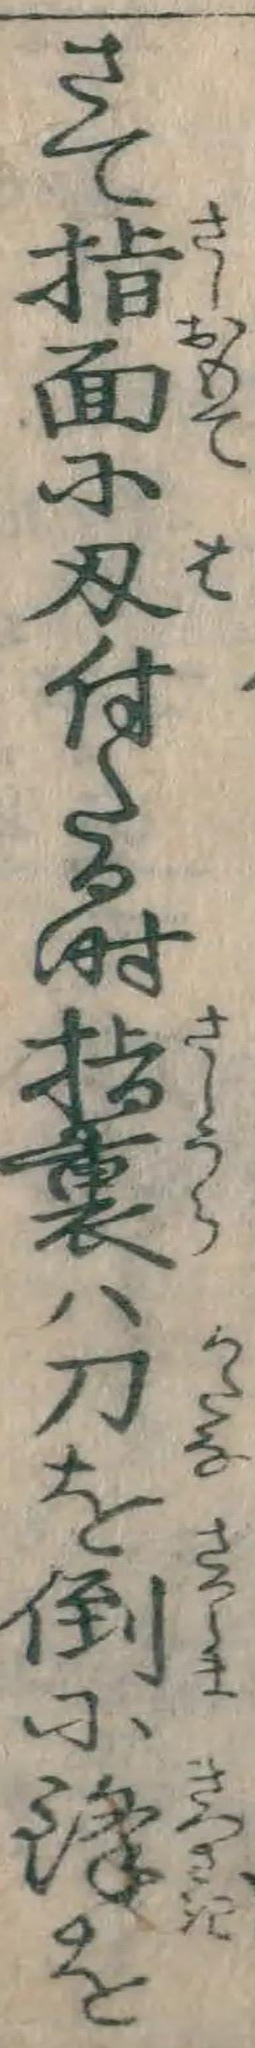さて指面に刃付たる時指裏は刀を倒に鋒を

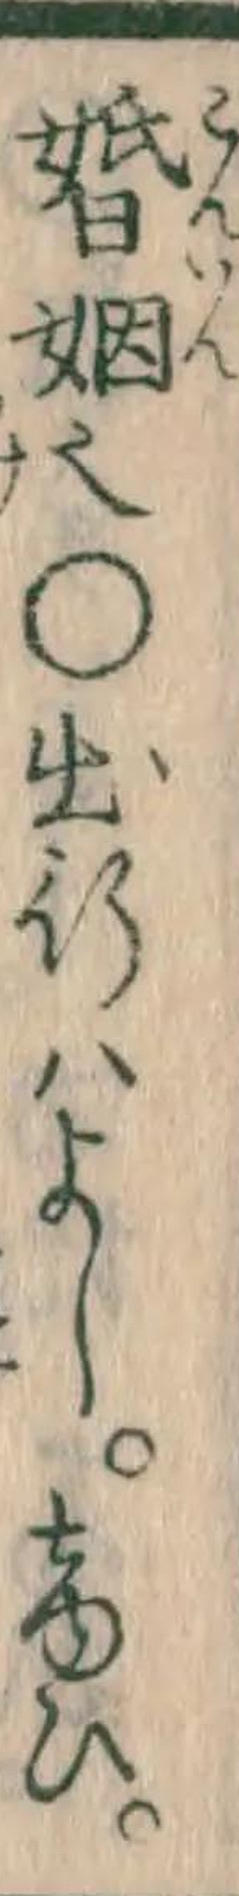婚姻也○出行はよし。商ひ。
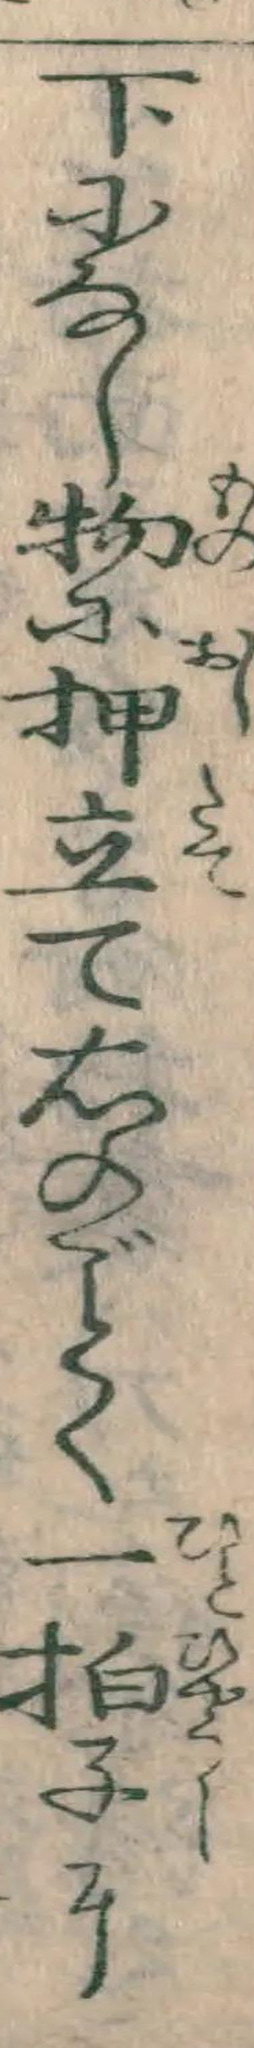下になし物に押立て右のごとく一拍子に
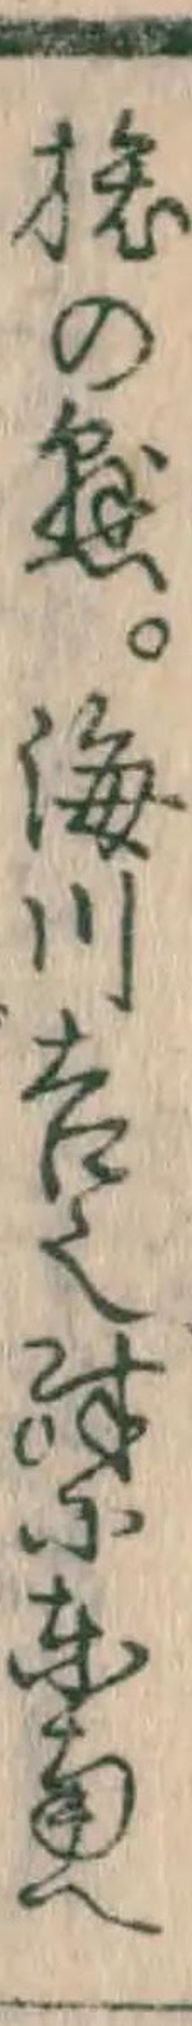旅の懸。海川吉也殊に東南へ
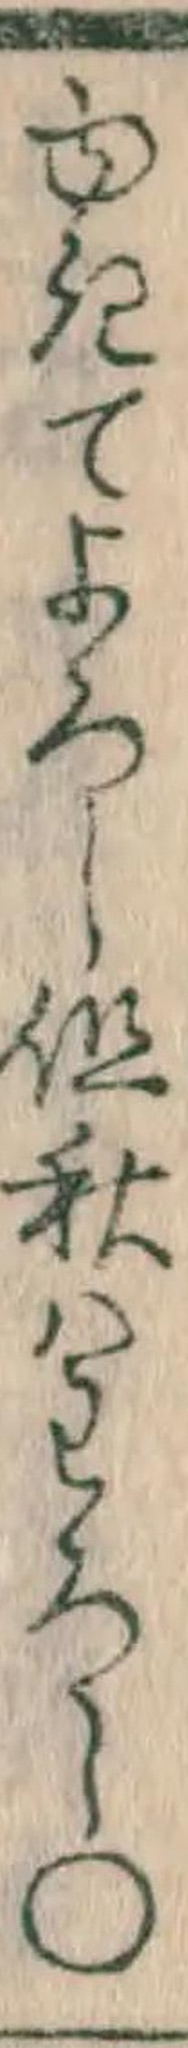ゆきてよろし但秋はわろし○
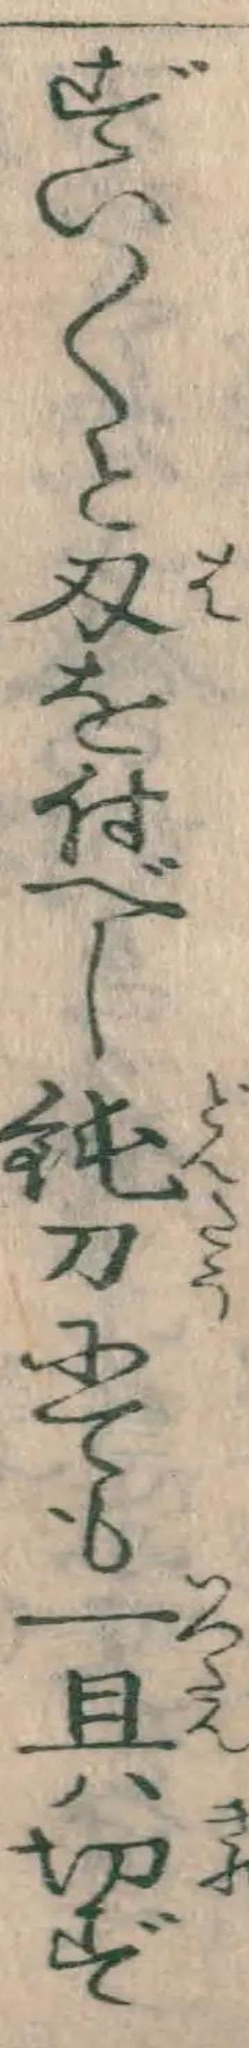ずい〳〵と刃を付べし鈍刀にても一旦は切ず
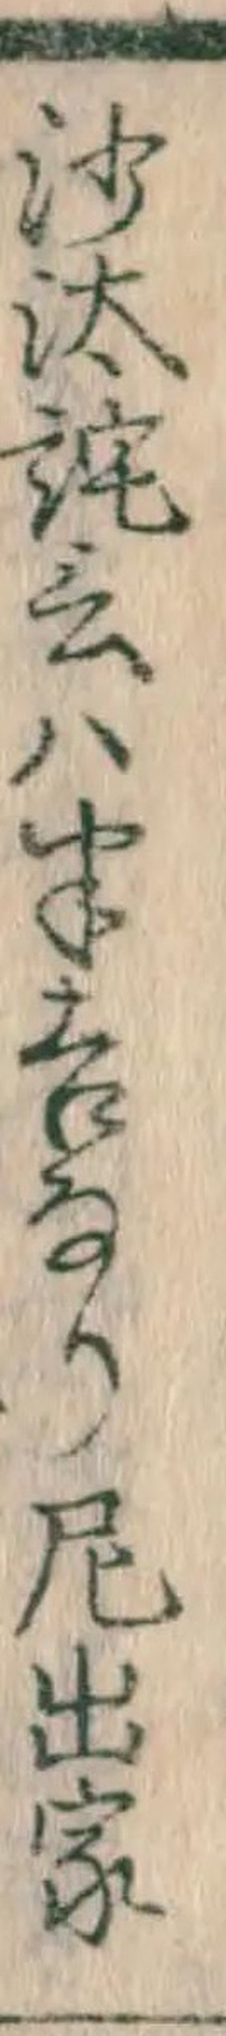沙汰詫言は半吉なり尼出家
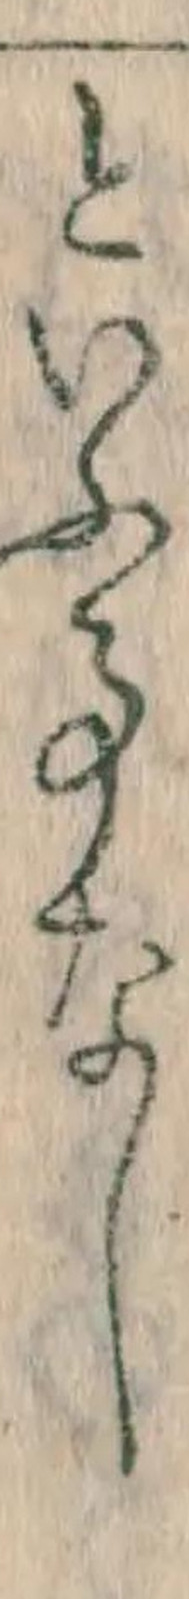といふ事なし
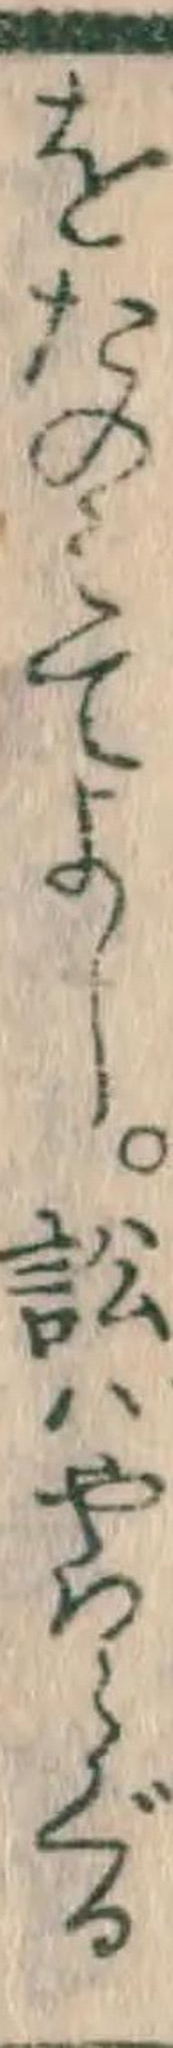をたのみてよし。訟はやはらぐる
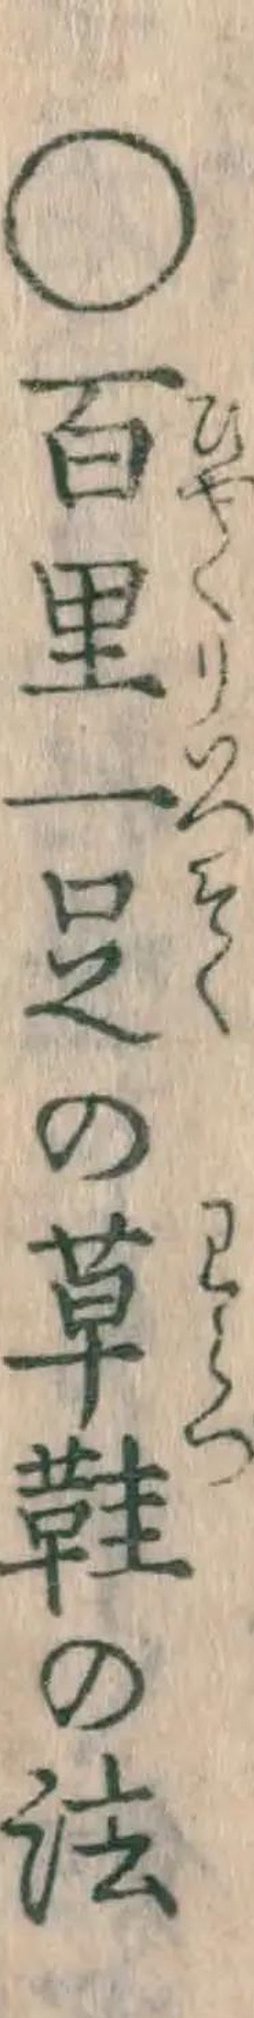○百里一足の草鞋の法
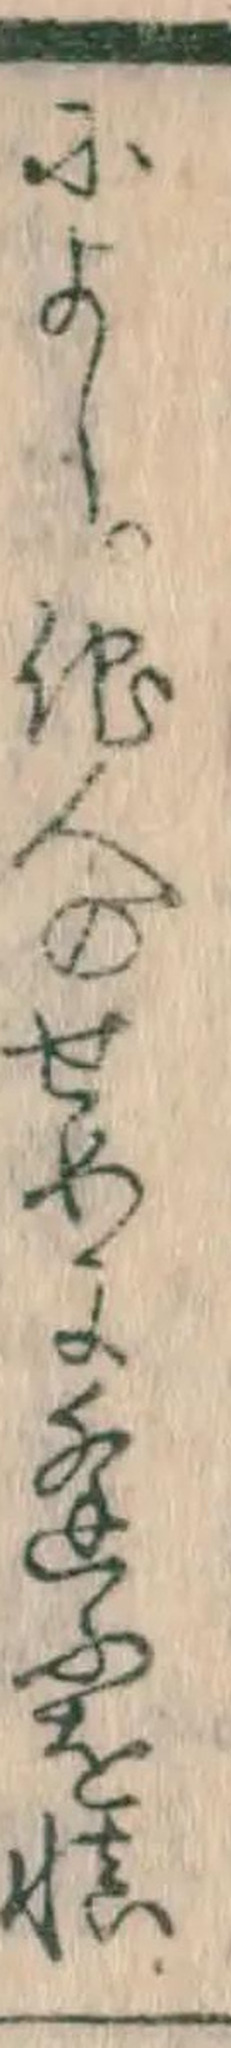によし。他人のせめに逢ふを慎
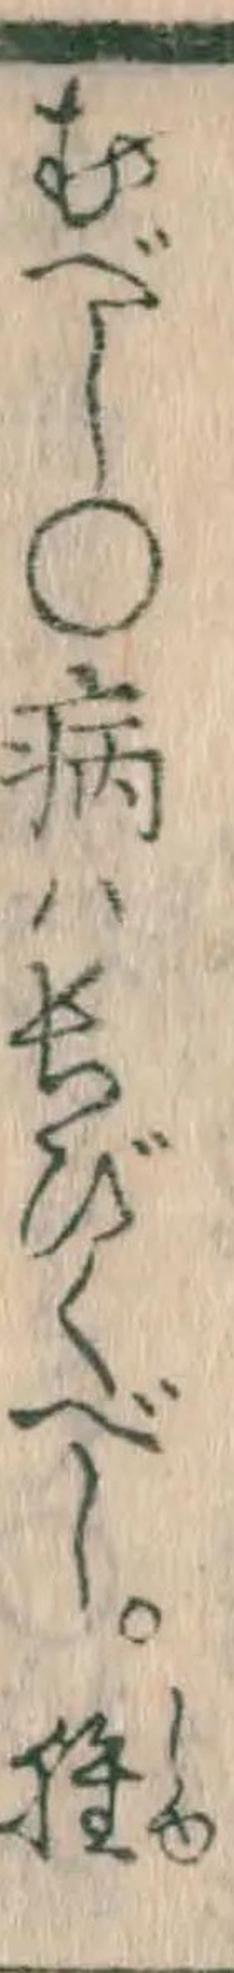むべし○病は長びくべし。腫
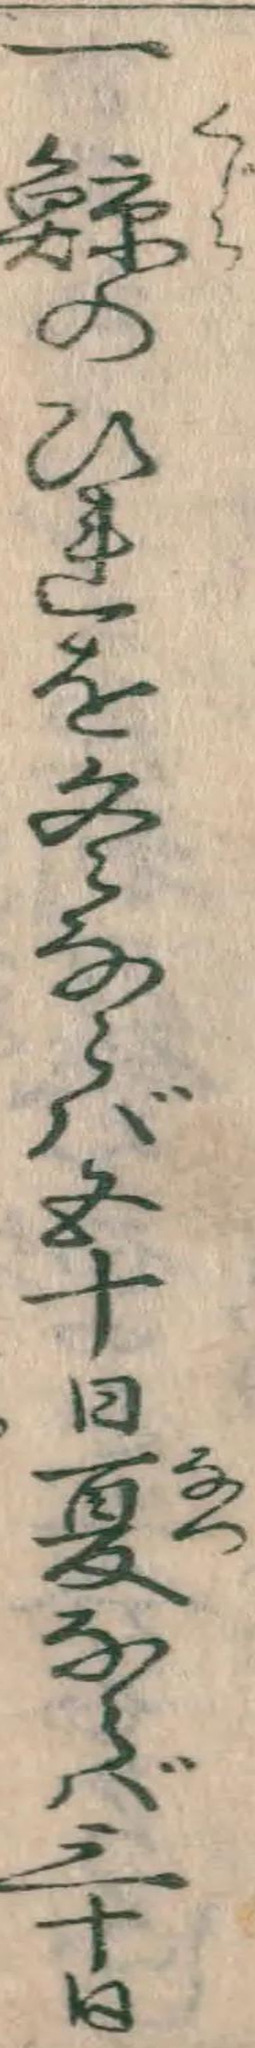一鯨のひれを冬ならば五十日夏ならば三十日
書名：広益秘事大全 3巻. [1]
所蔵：国立国会図書館 National Diet Library, JAPAN
